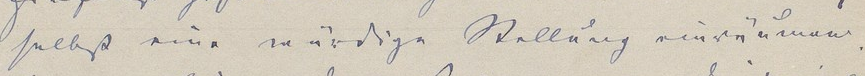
selbst eine würdige Stellung einräumen.
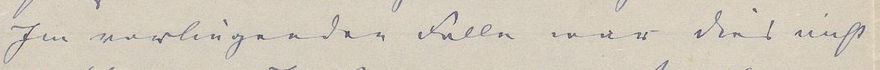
Im vorliegenden Falle war dies dies nicht
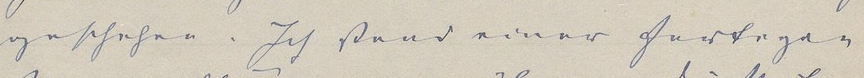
geschehen. Ich stand einer fertigen
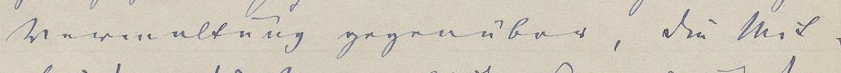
Verwaltung gegenüber, die Mit-
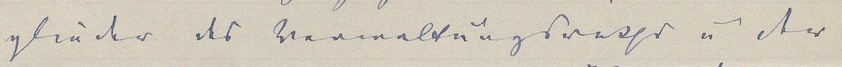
glieder des Verwaltungsraths u der
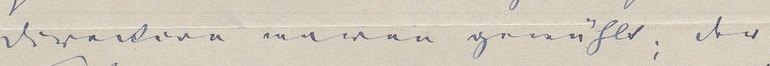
Direction waren gewählt; der
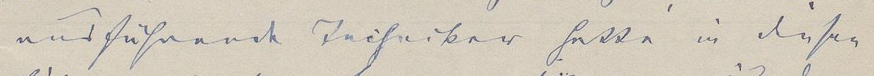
ausführende Techniker hatte in diesen
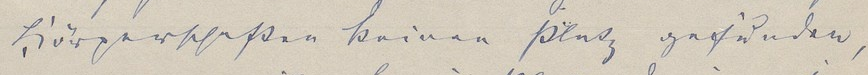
Körperschaften keinen Platz gefunden,
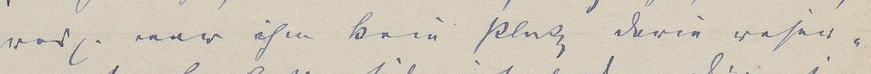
resp. war ihm kein Platz darin reser-
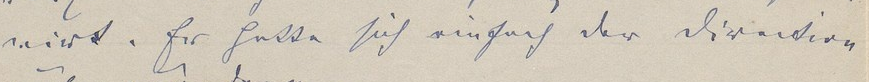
virt. Er hatte sich einfach der Direktion
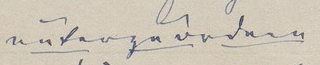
unterzuordnen.
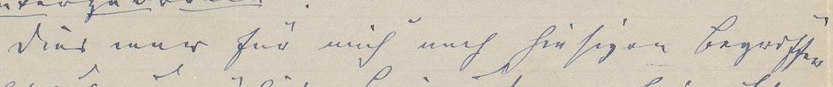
Dies war für mich nach hiesigen Begriffen
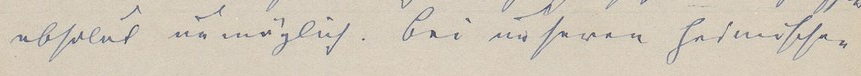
absolut unmöglich. Bei unseren heimischen
